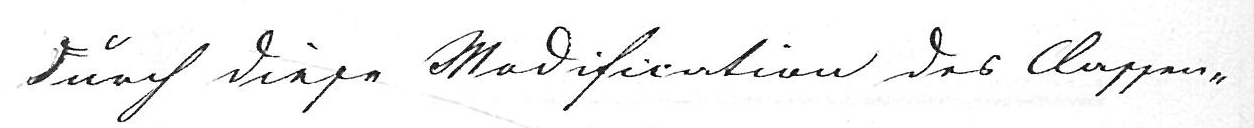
durch diese Modification des Classen-
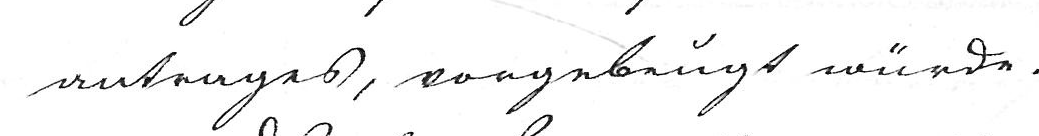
antrages, vorgebeugt würde.
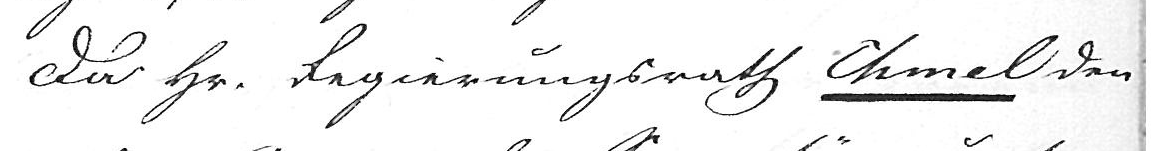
Da Hr. Regierungsrath Chmel den
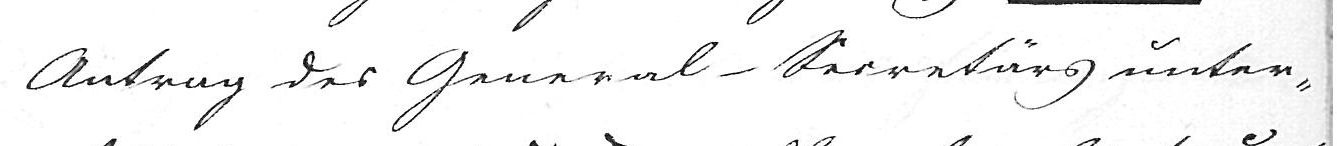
Antrag des General-Secretärs unter-
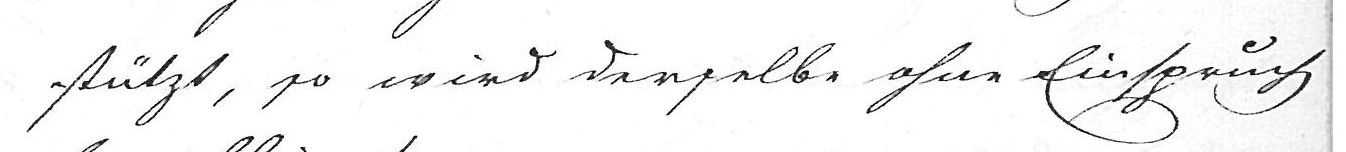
stützt, so wird derselbe ohne Einspruch
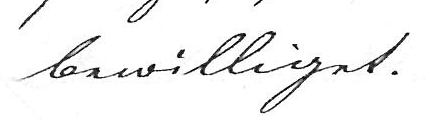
bewilliget.
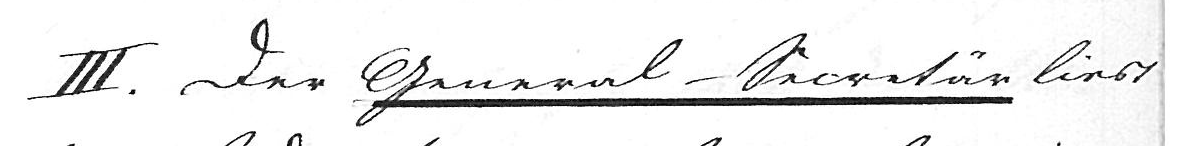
III. Der General-Secretär liest
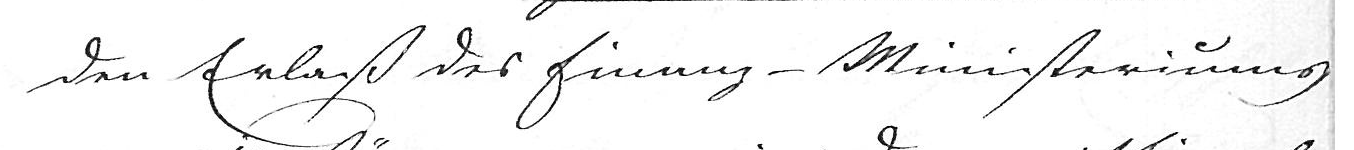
den Erlaß des Finanz-Ministeriums
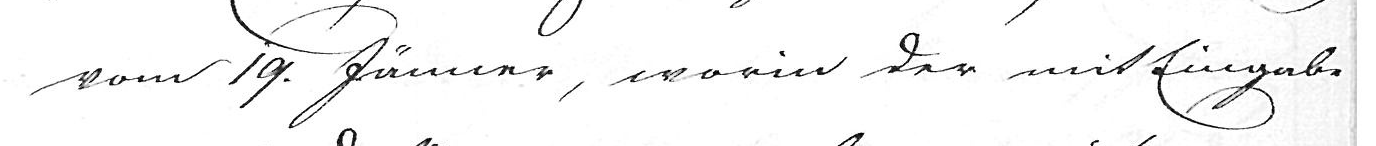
vom 19. Jänner, worin der mit Eingabe
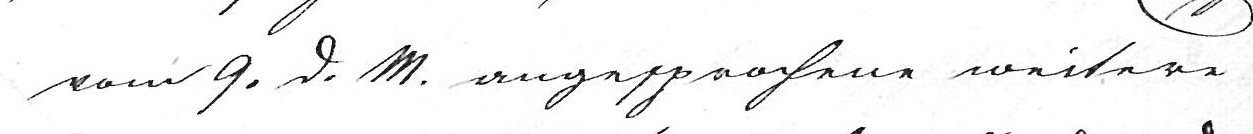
vom 9. d. M. angesprochene weitere
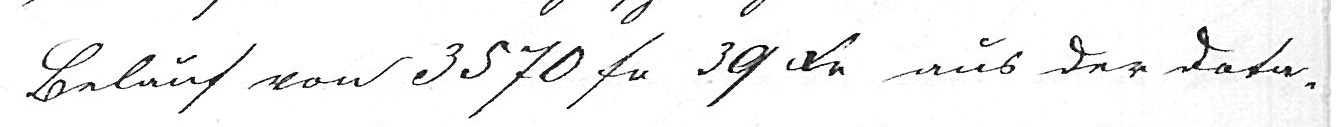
Belauf von 3570 fr 39 Kr aus der Dota-
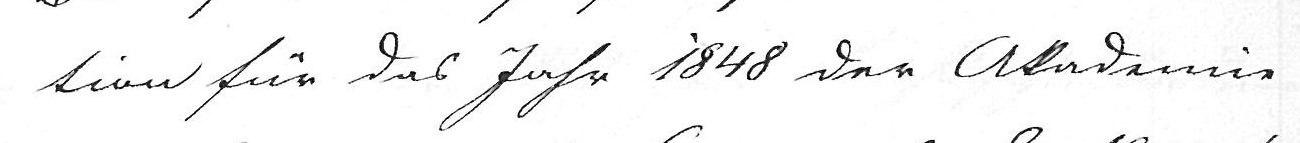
tion für das Jahr 1848 der Akademie
